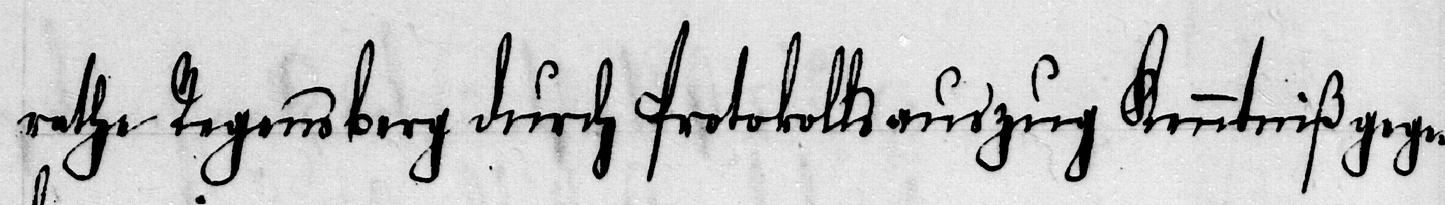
rathe Regensberg durch Protokollsauszug Kenntniß geg¬
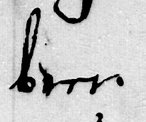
eben.
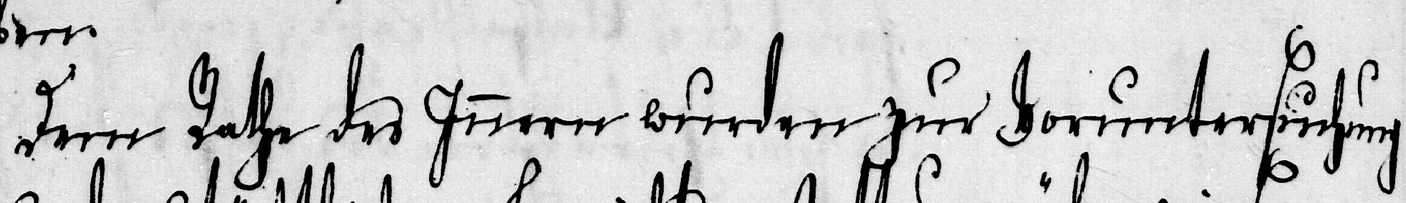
Dem Rathe des Innern wurden zur Voruntersuchung
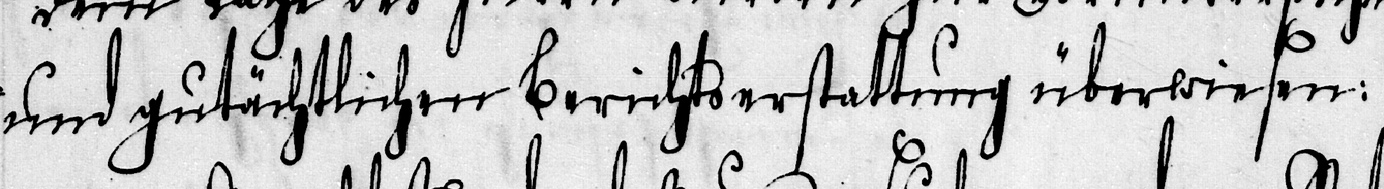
und gutächtlichen Berichtserstattung überwiesen:
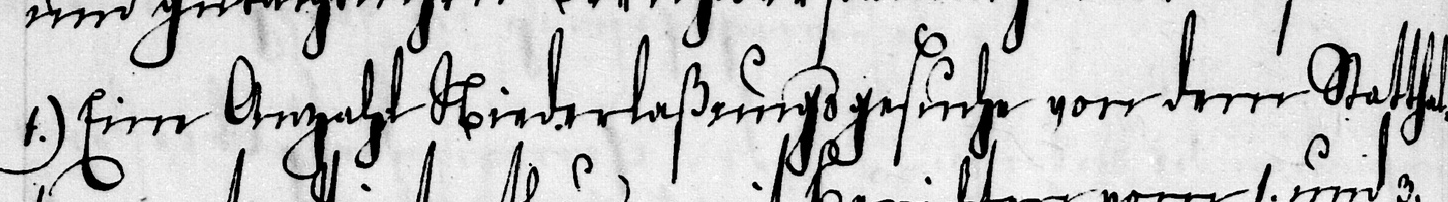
1.) Eine Anzahl Niederlaßungsgesuche von dem Statth¬
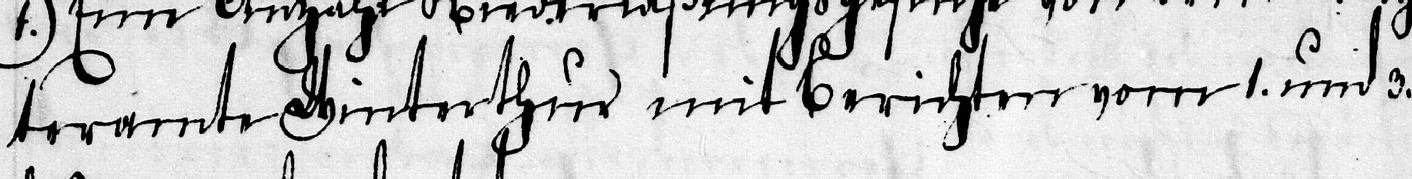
teramte Winterthur mit Berichten vom 1. und 3.
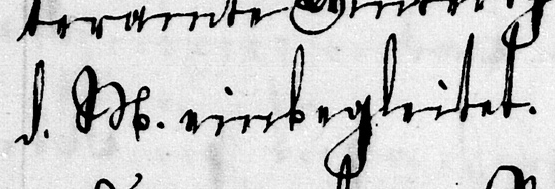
d. M. einbegleitet.
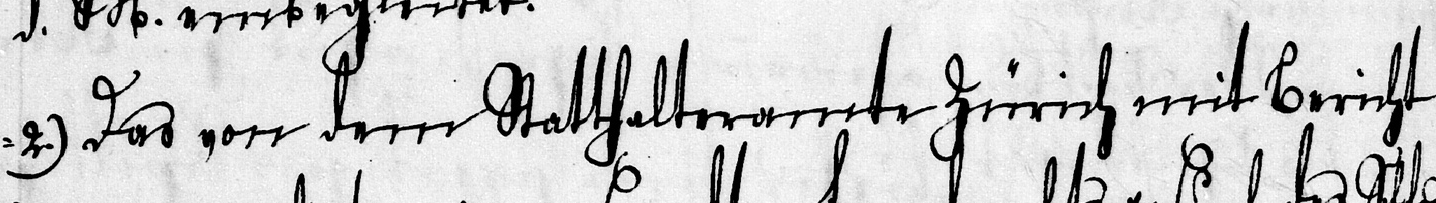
2.) Das von dem Statthalteramte Zürich mit Bericht
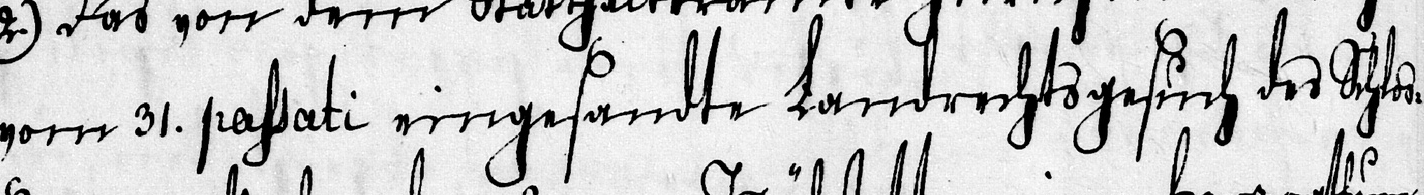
vom 31. passati eingesandte Landrechtsgesuch des Schlo¬
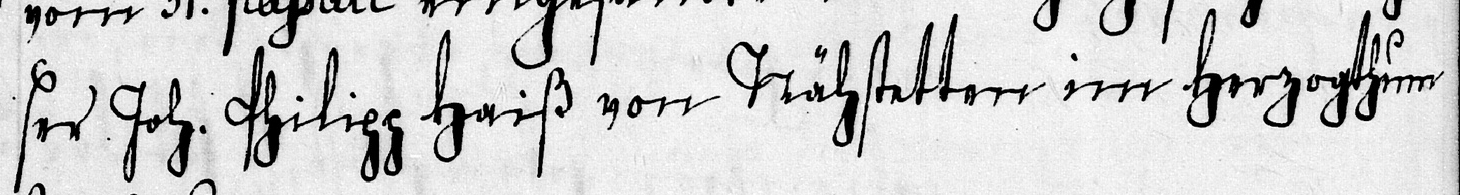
ßer Joh. Philipp Haiß von Nähstetten im Herzogthum
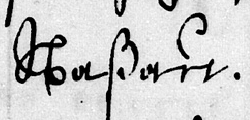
Naßau.
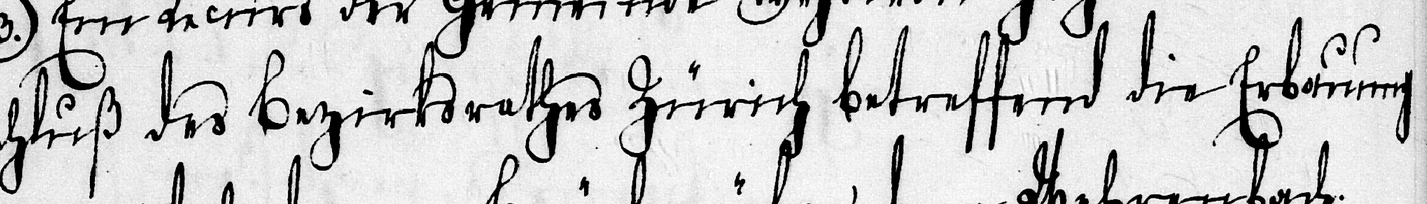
chluß des Bezirksrathes Zürich betreffend die Erbauung
